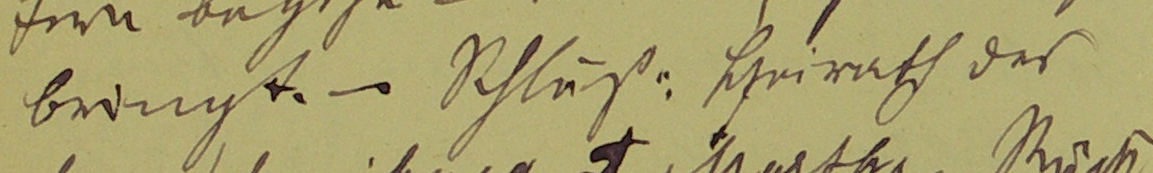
bringt.- Schluß: Heirat des
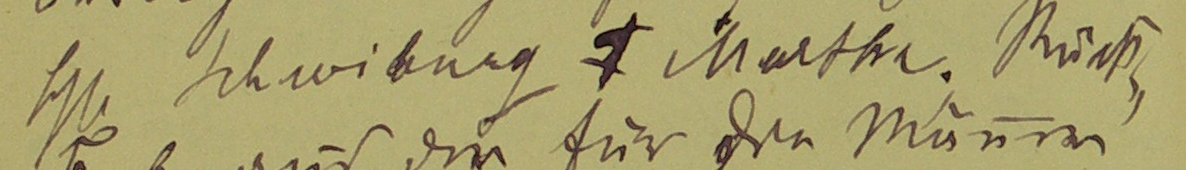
H. Schwiburg mit Martha. Rück¬
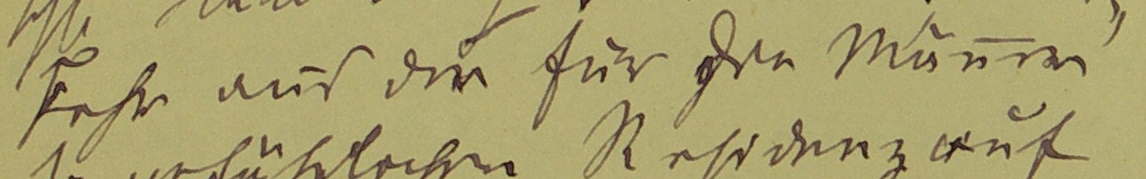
kehr aus der für die Männer
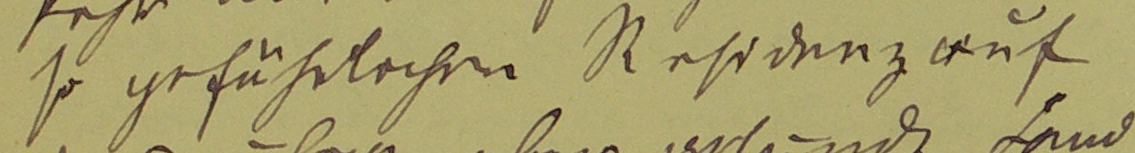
so gefährlichen Residenz auf das
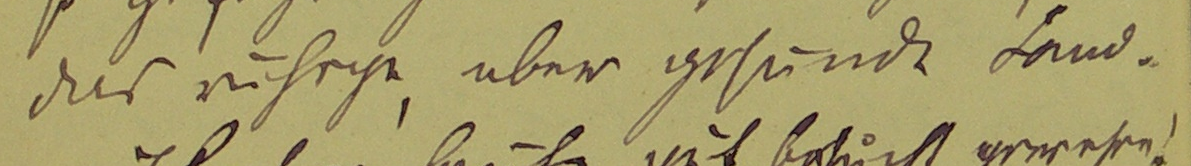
ruhige, aber gesunde Land.
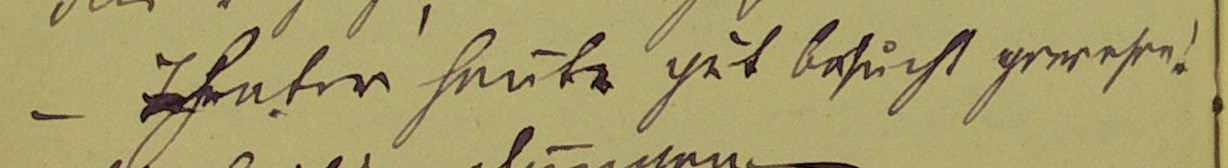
---Theater heute gut besucht gewesen!-
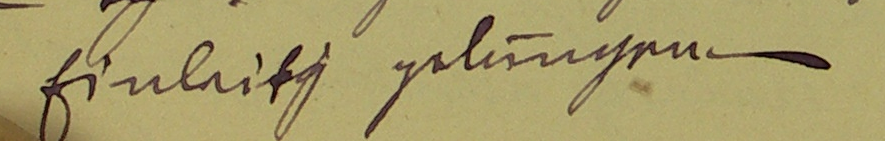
Einleitung gelungen___
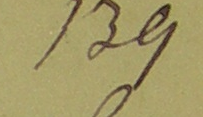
139
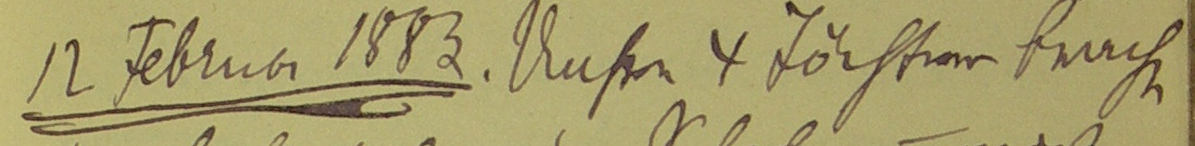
13. Februar 1883. Unsere 4 Töchter brach-
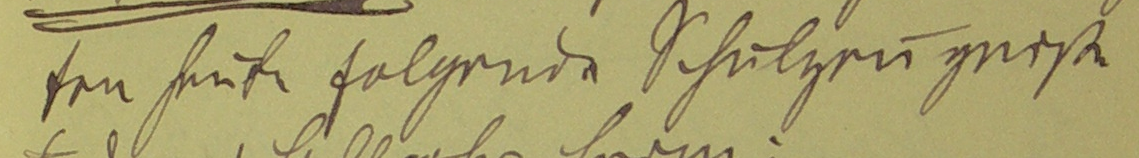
ten heute folgende Schulzeugniße
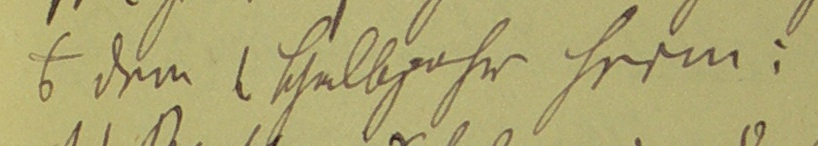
aus dem 1-ten Halbjahr heim:
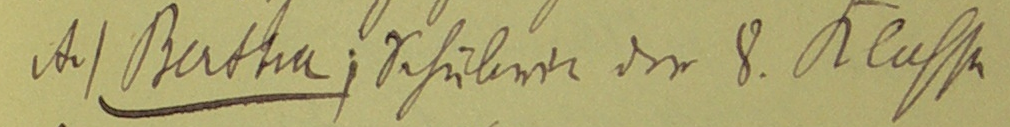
A ) Bertha. Schülerin der 8. Klasse.
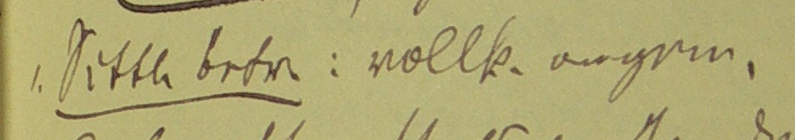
1. Sittl. Betr. : vollk. angem.
